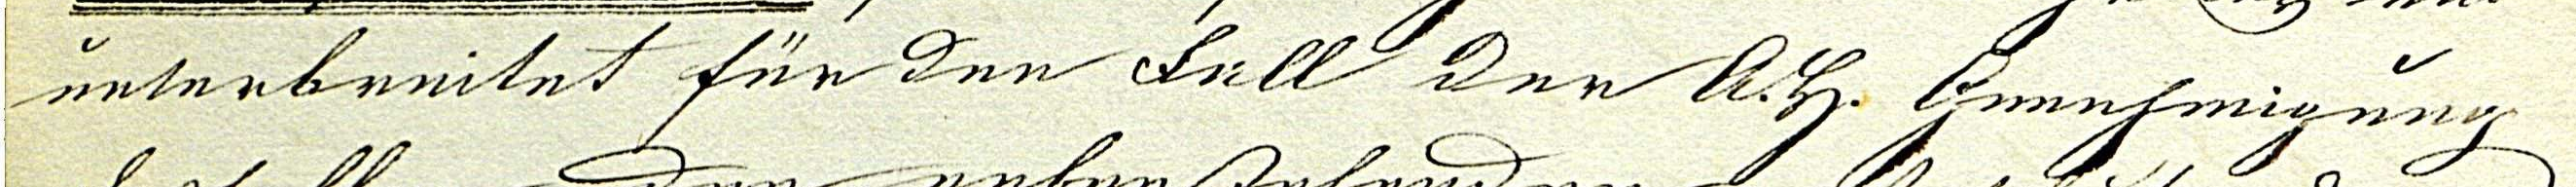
unterbreitet für den Fall den AH Genehmigung
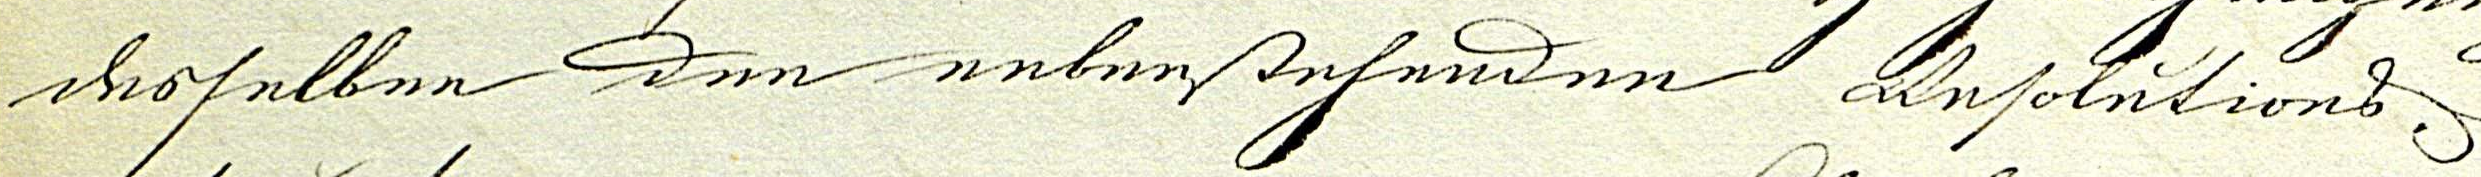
desselben den nebenstehenden Resolutions
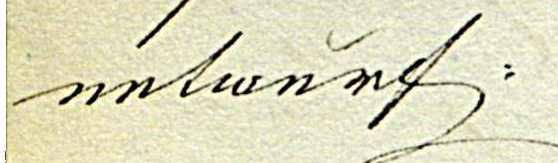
entwurf
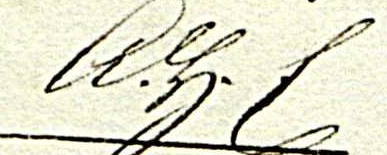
Ah. E.
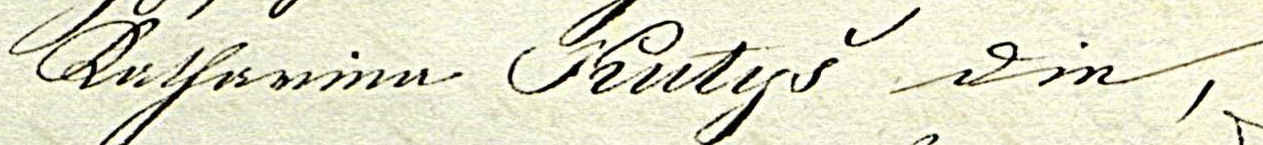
Katharina Kutyś die
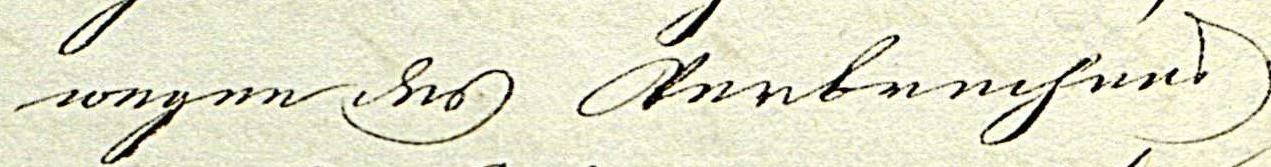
wegen des Verbrechens
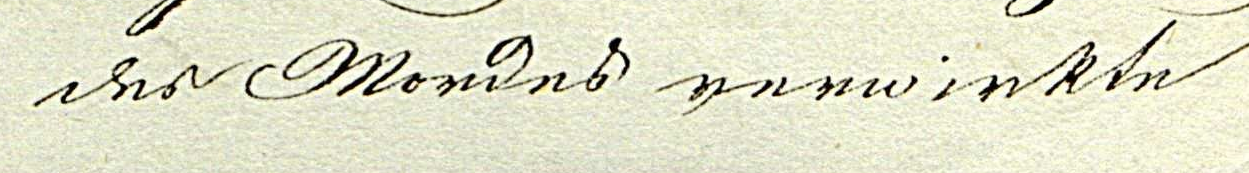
des Mordes verwirkte
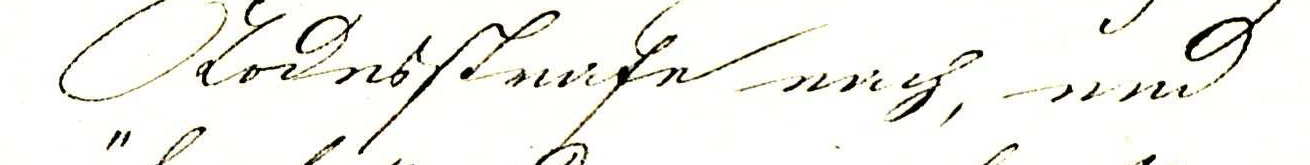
Todesstrafe nach
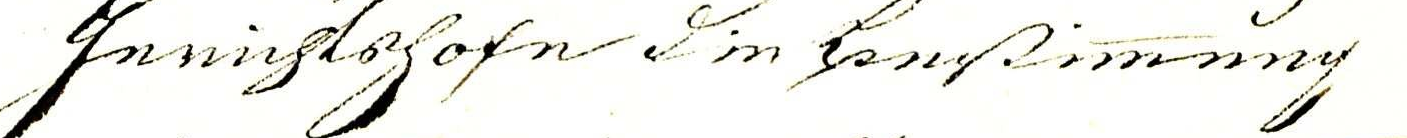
Gerichtshofe die Bestimmung
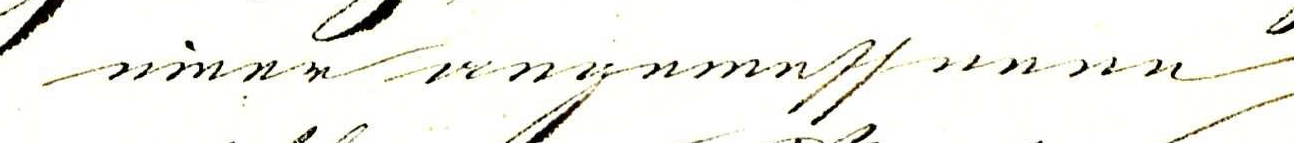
einer angemessenen
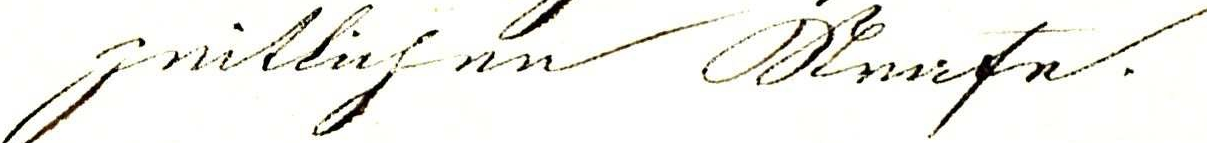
zeitlichen Strafe.
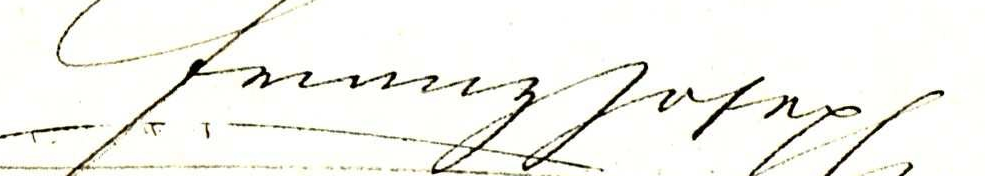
Franz Joseph
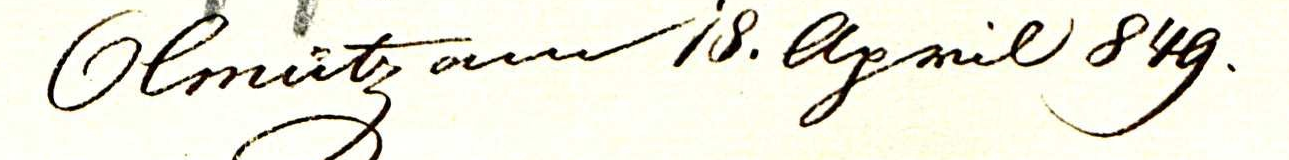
Olmütz am 18. April 1849
